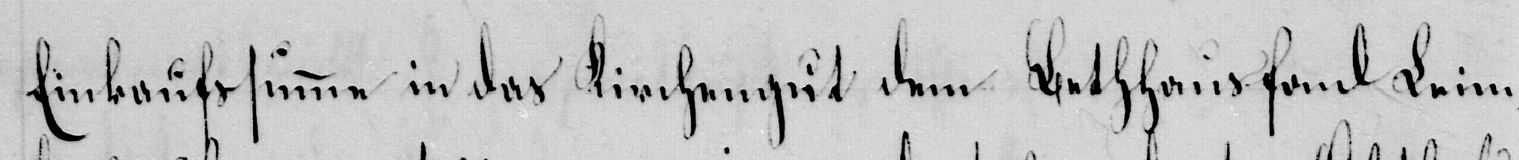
Einkaufssumme in das Kirchengut dem Bethhausfond Leim¬
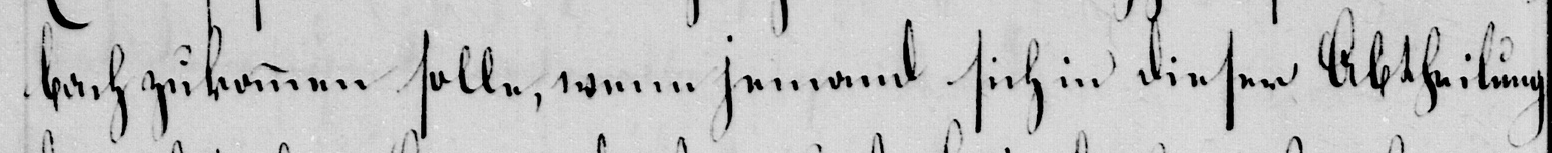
bach zukommen solle, wenn jemand sich in dieser Abtheilung
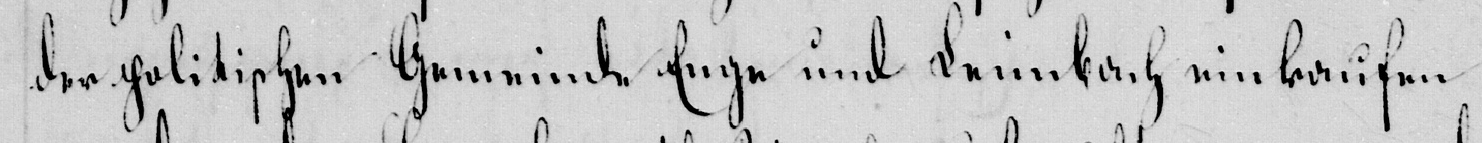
der politischen Gemeinde Enge und Leimbach einkaufen
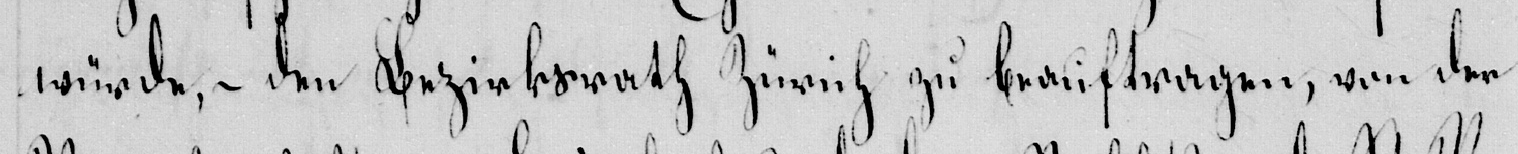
würde, – den Bezirksrath Zürich zu beauftragen, von der
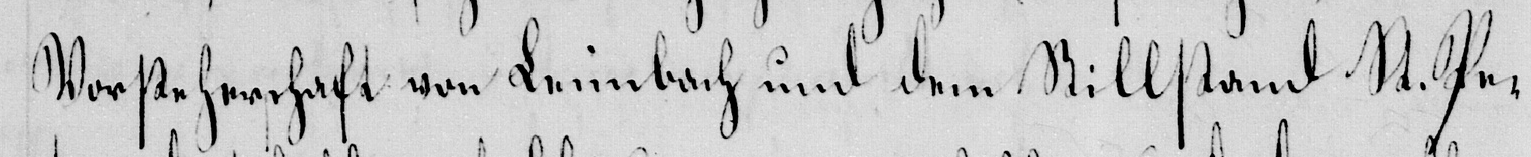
Vorsteherschaft von Leimbach und dem Stillstand St. Pe¬
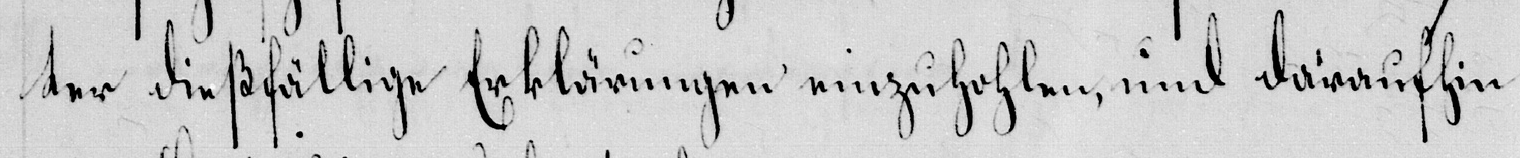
ter dießfällige Erklärungen einzuhohlen, und daraufhin
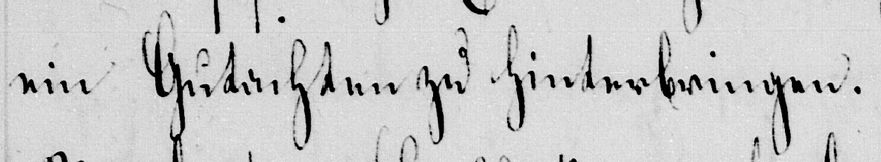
ein Gutachten zu hinterbringen.
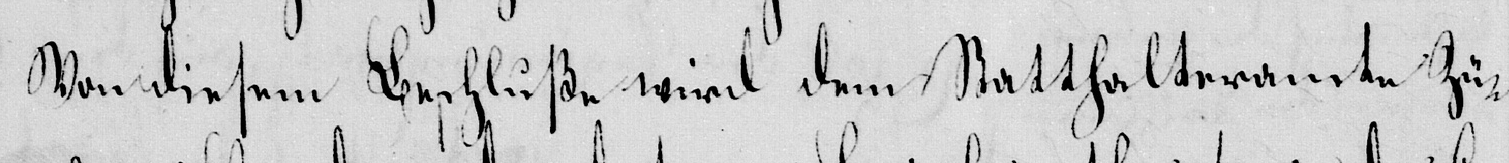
Von diesem Beschluße wird dem Statthalteramte Zü¬
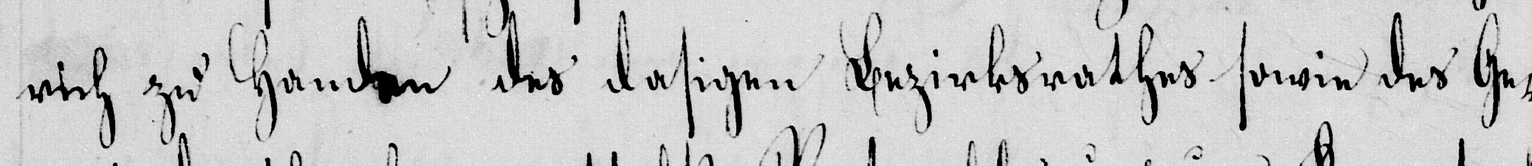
rich zu Handen des dasigen Bezirksrathes sowie des Ge¬
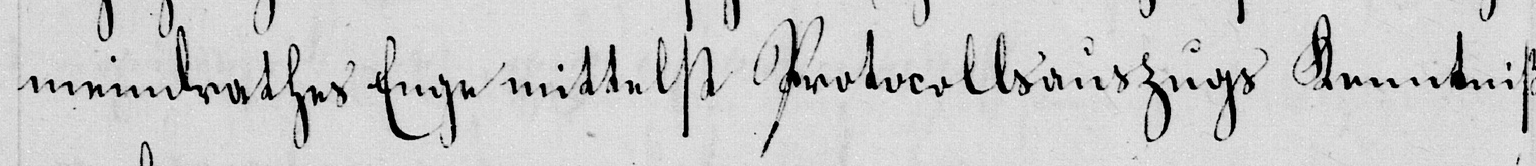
meindrathes Enge mittelst Protocollsauszugs Kenntniß
